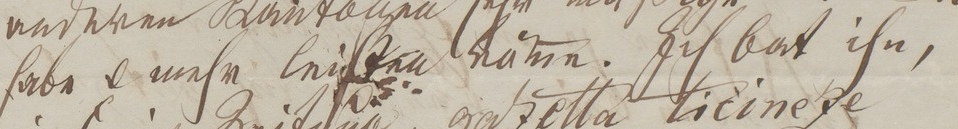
habe & mehr leisten könne. Ich bat ihn,
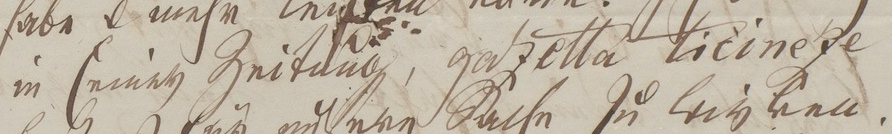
in seiner Zeitung, Gazetta Ticineze
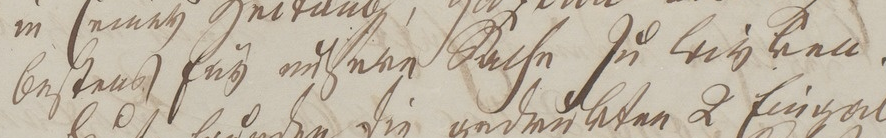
bestens für unsere Sache zu wirken.
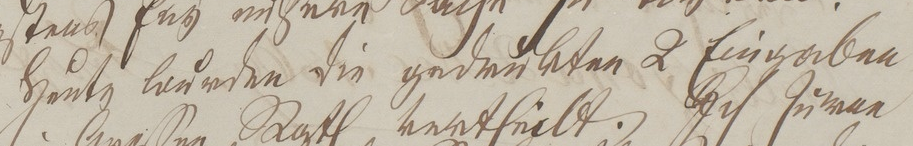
Heute wurden die gedrukten 2 Eingaben
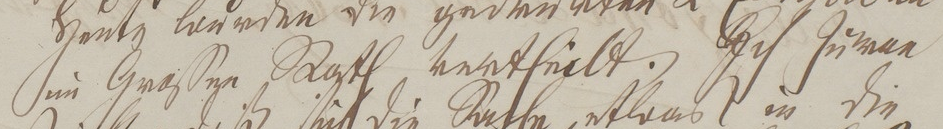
im Grossen Rath vertheilt. Ich zürne
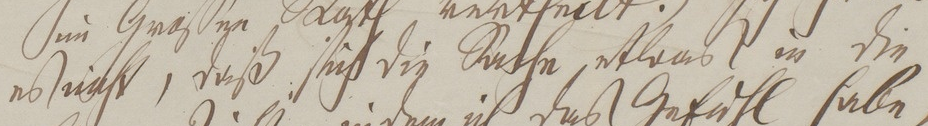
es nicht, daß sich die Sache etwas in die
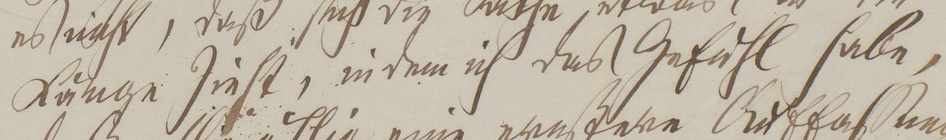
Länge zieht, indem ich das Gefühl habe,
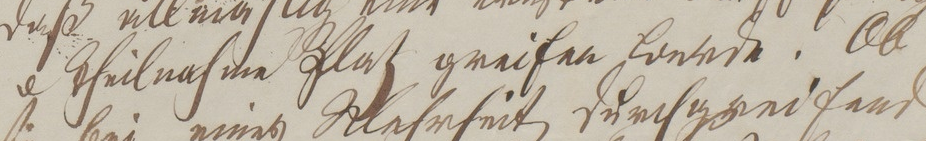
& Theilnahme Plaz greifen werde. Ob
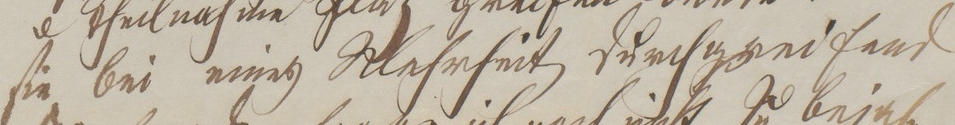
sie bei einer Mehrheit durchgreifend
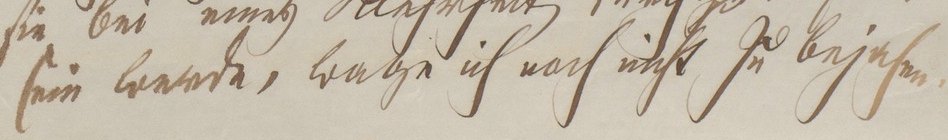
sein werde, wage ich noch nicht zu bejahen.
